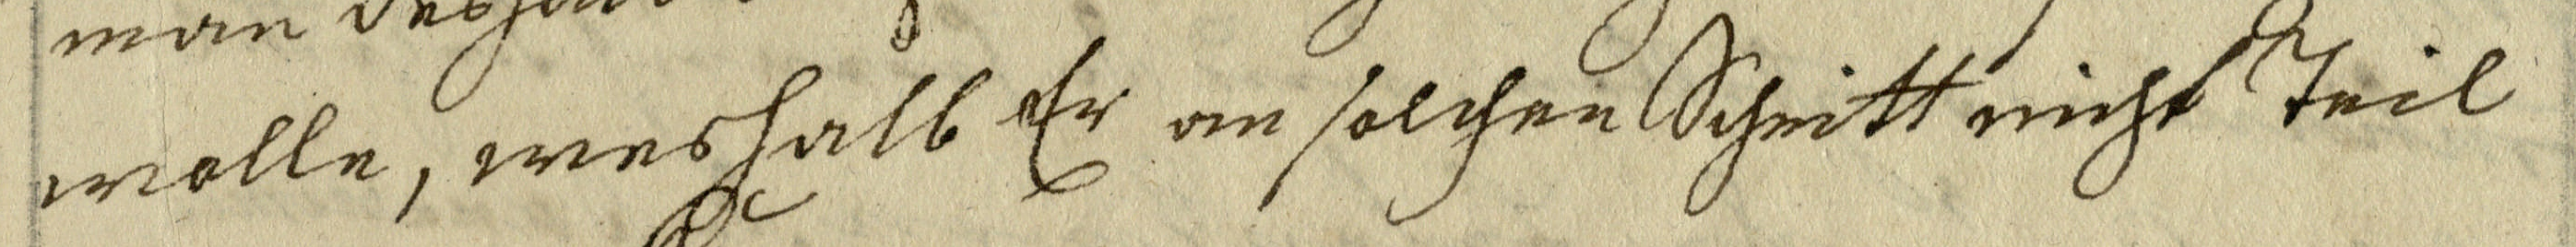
wolle, weshalb Er an solchen Schritt nicht Teil
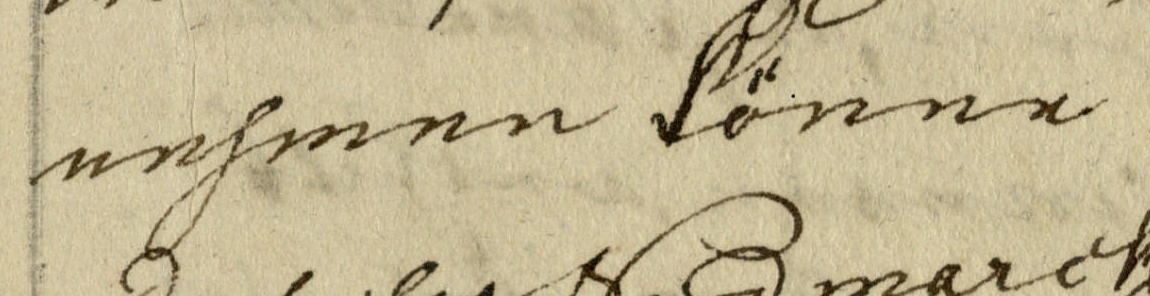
nehmen könne.
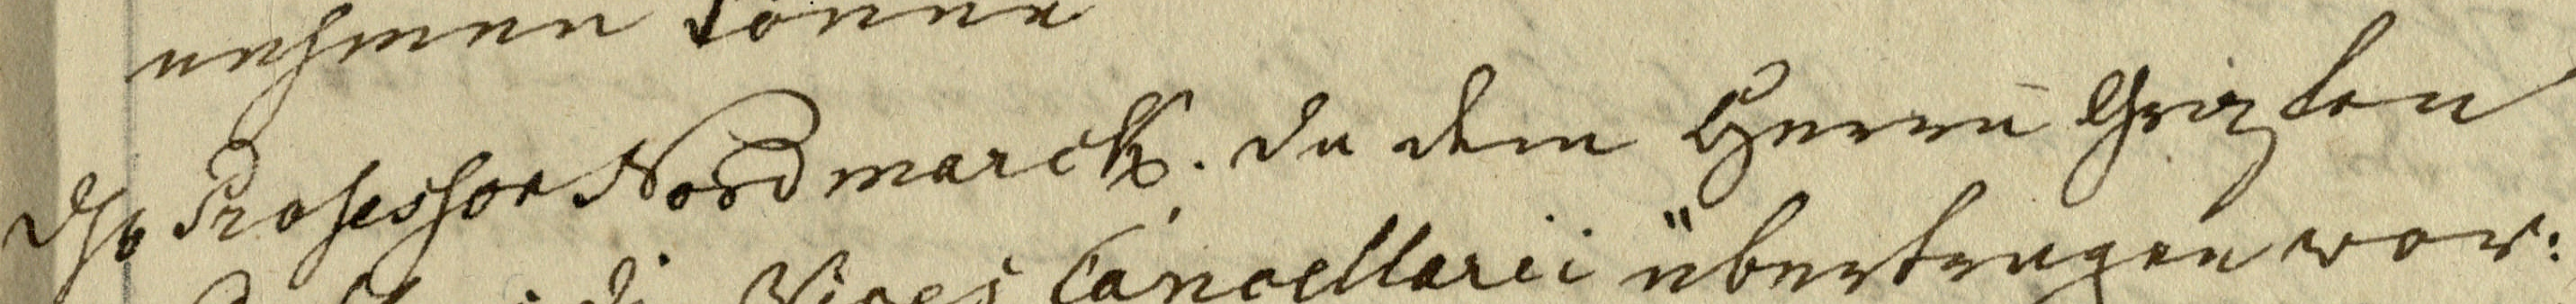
dh. Prof. Nordmarck. da dem Herrn Grafen
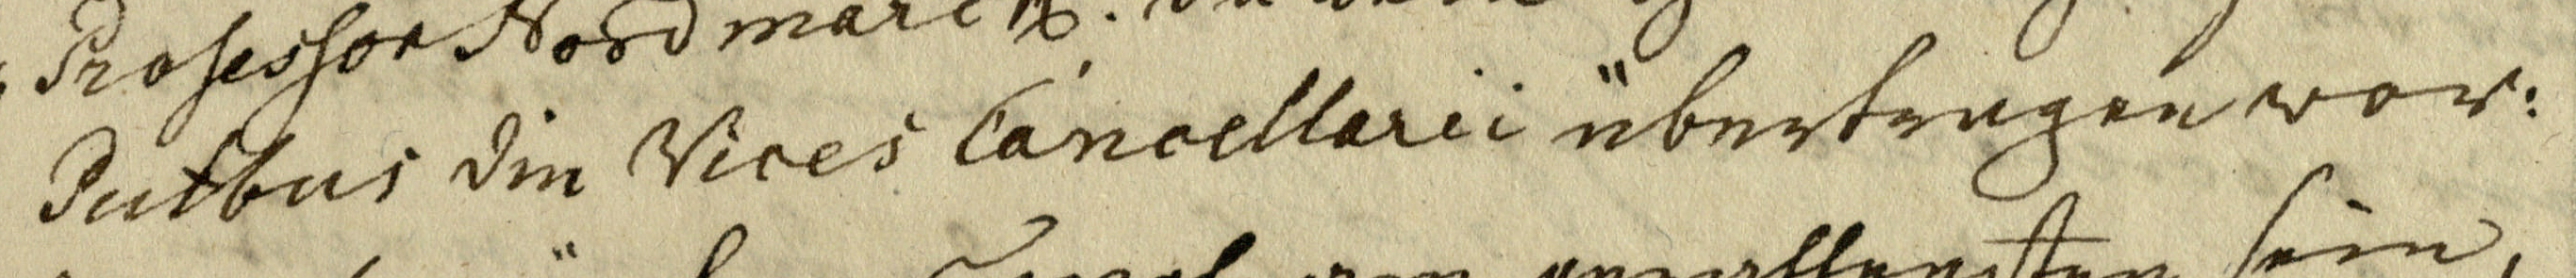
Putbus die Vices Cancellarii übertragen wor¬
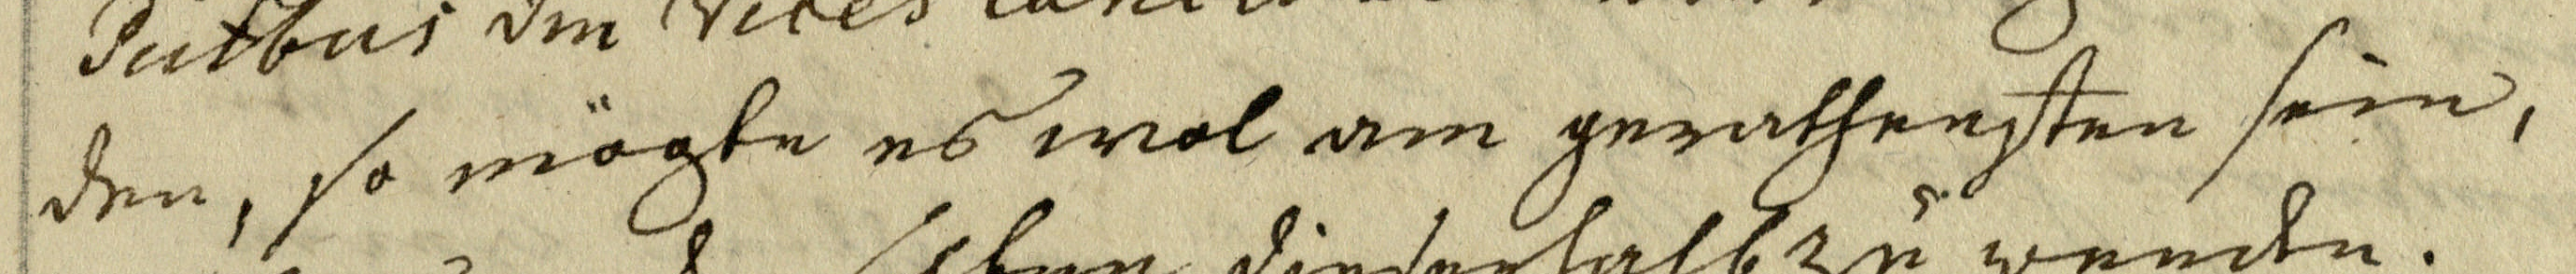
den, so mögte es wol am gerathensten sein,
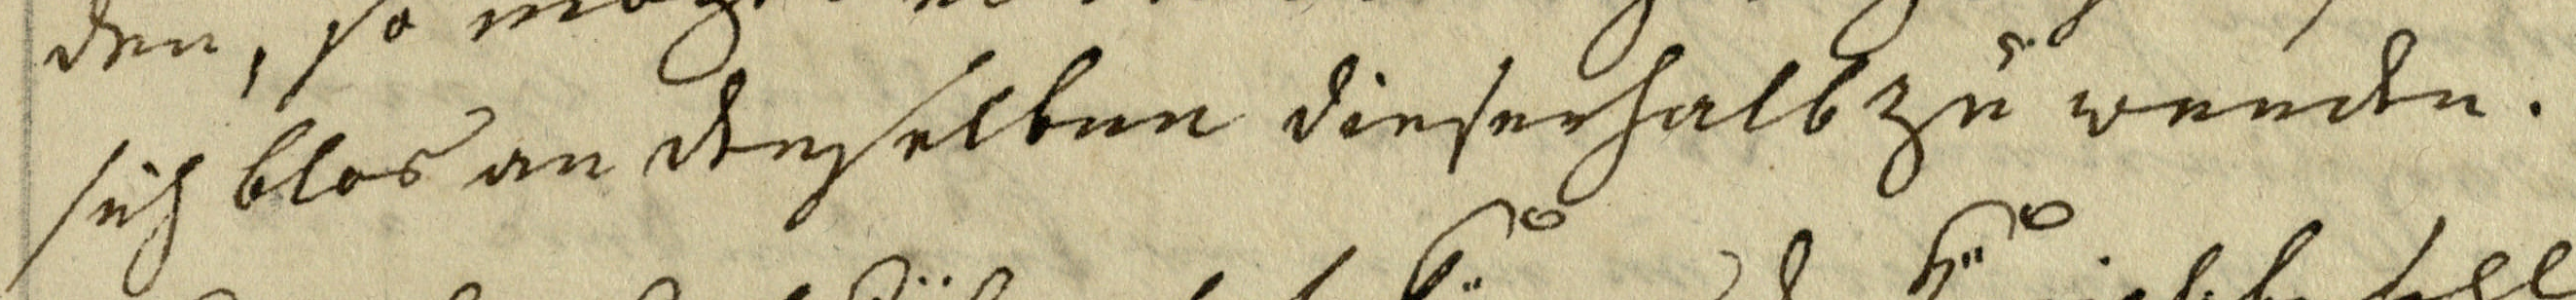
sich blos an denselben dieserhalb zu wenden.
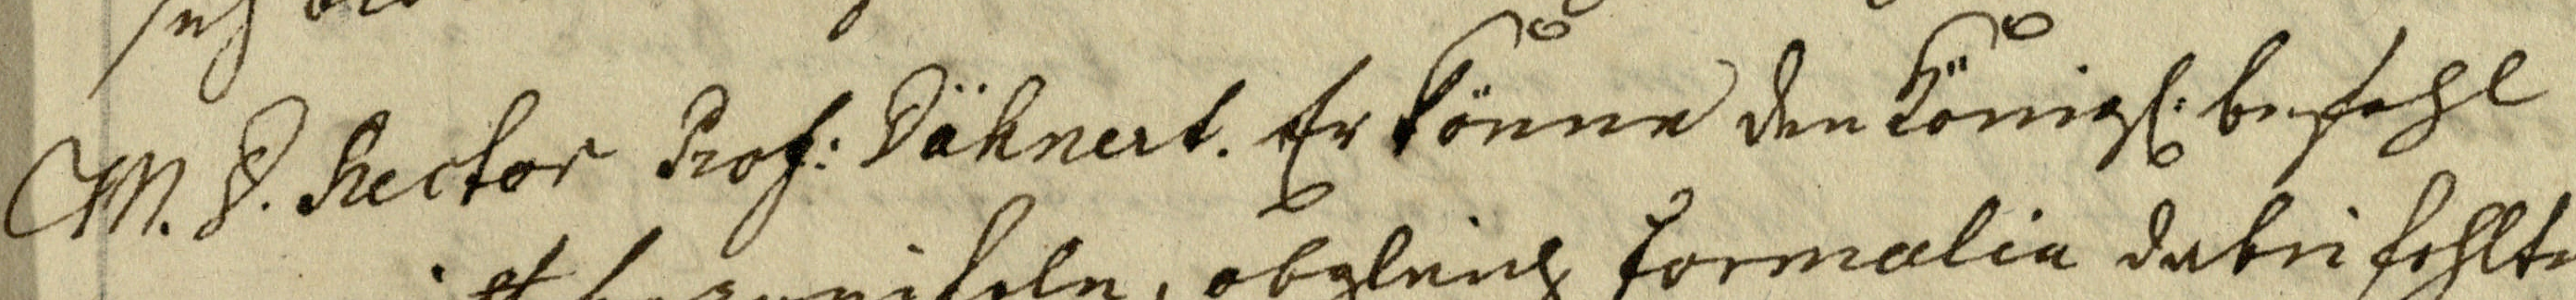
M. D. Rector Prof. Dähnert. Er könne den Königl. Befehl
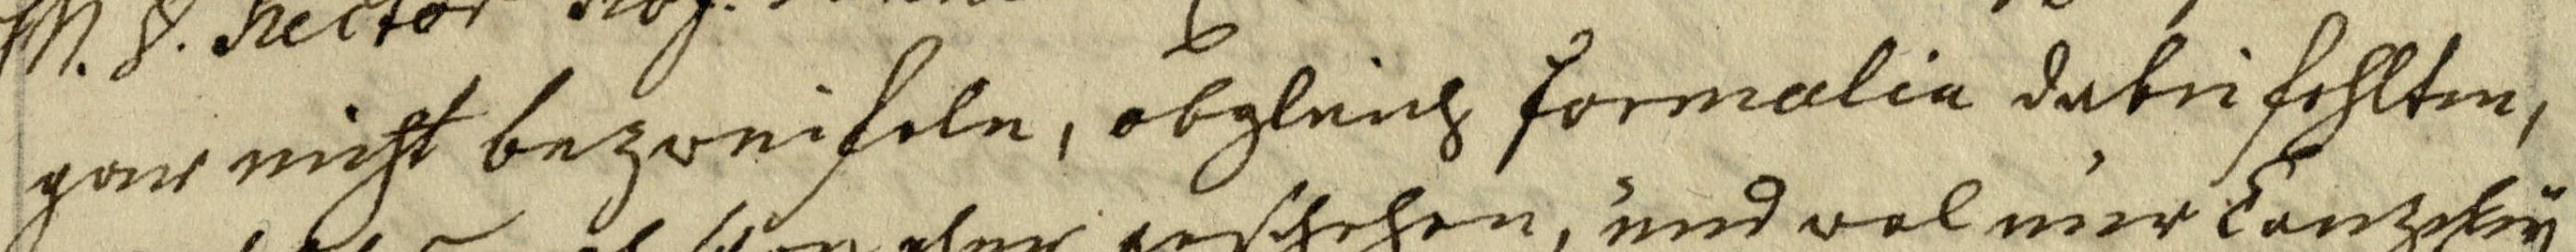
gar nicht bezweifeln, obgleich formalia dabei fehlten,
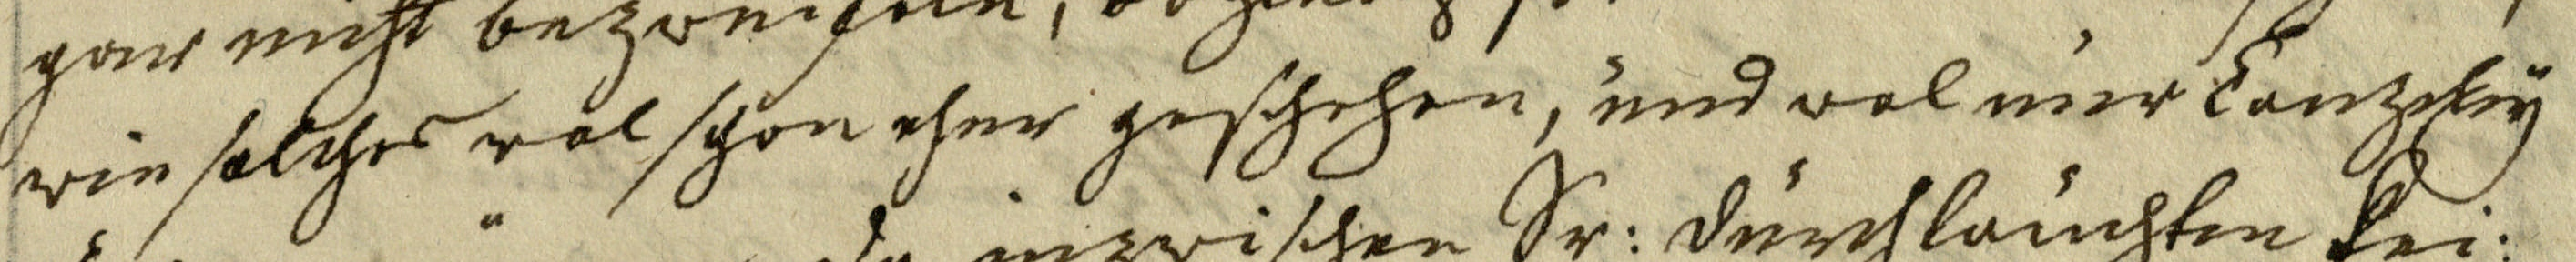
wie solches wol schon eher geschehen, und wol nur Canzeleÿ
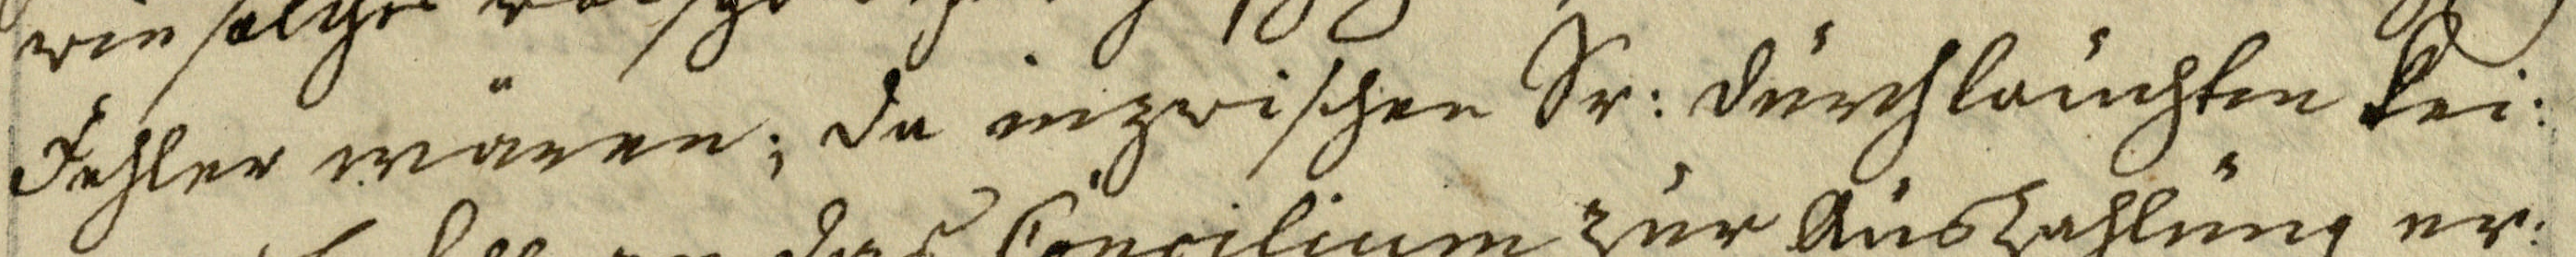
Fehler wären; da inzwischen Sr Durchlauchten kei¬
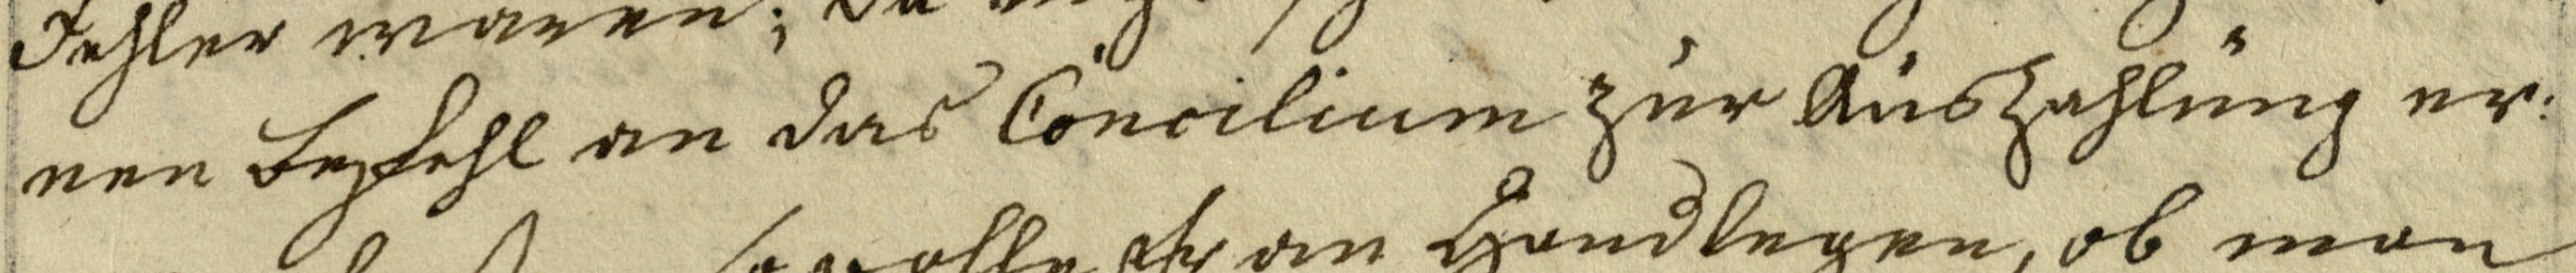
nen Befehl an das Concilium zur Auszahlung er¬
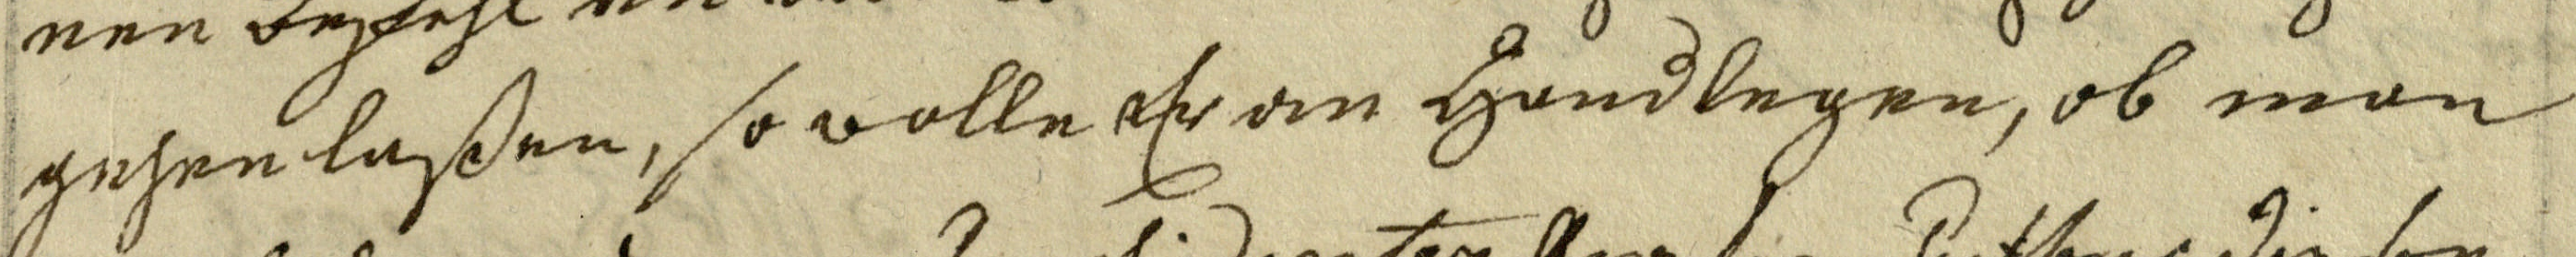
gehen laßen, so wolle Er an Hand legen, ob man
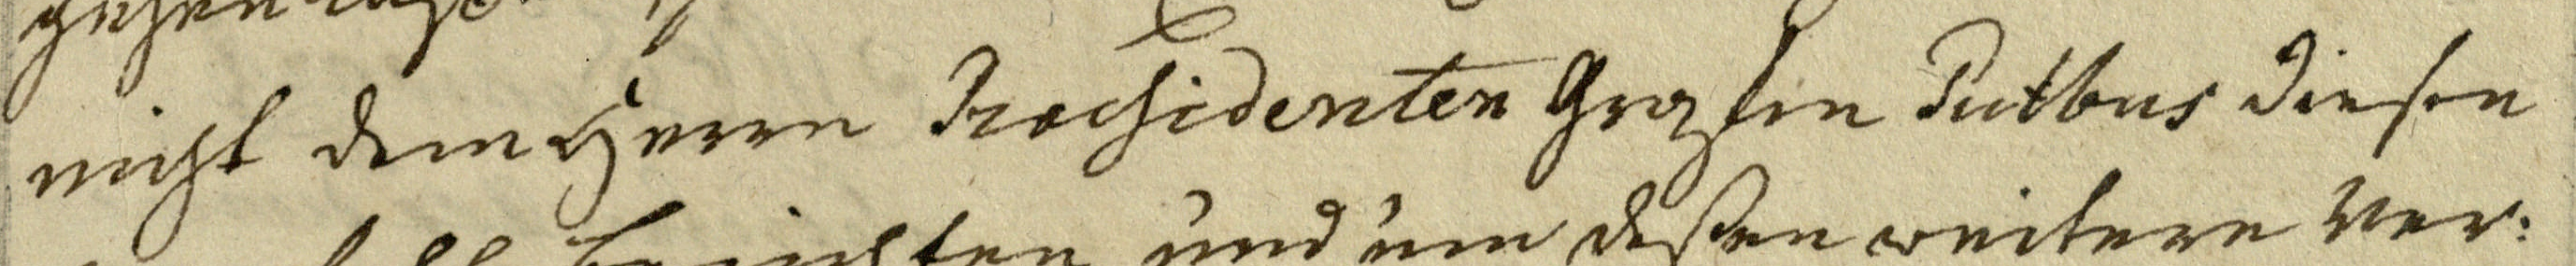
nicht dem Herrn Praesidenten Grafen Putbus diesen
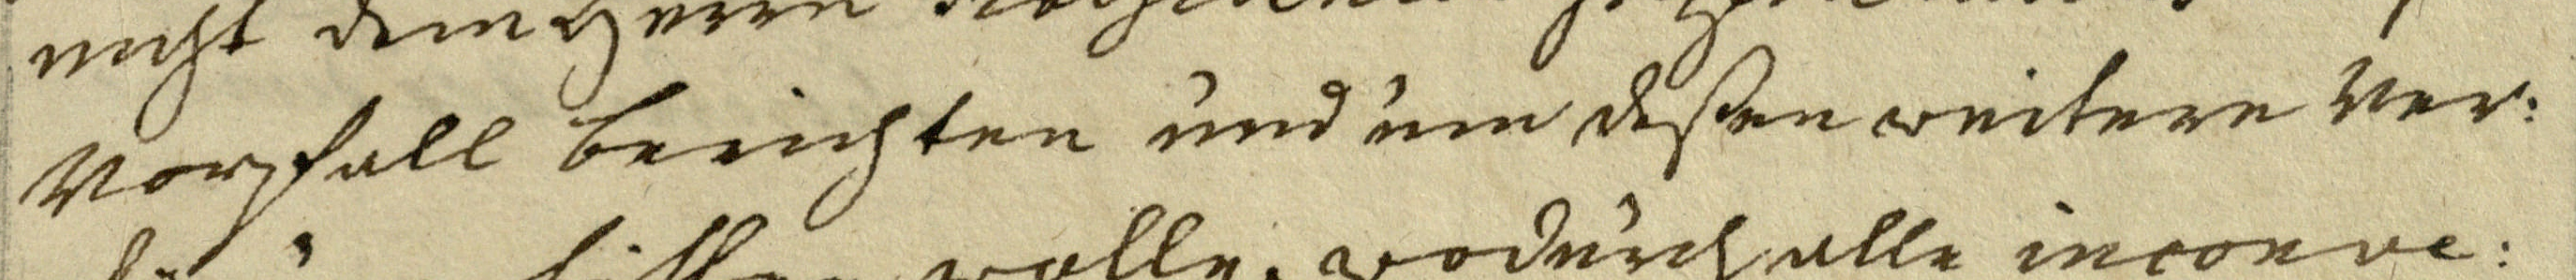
Vorfall berichten und um deßen weitere Ver¬
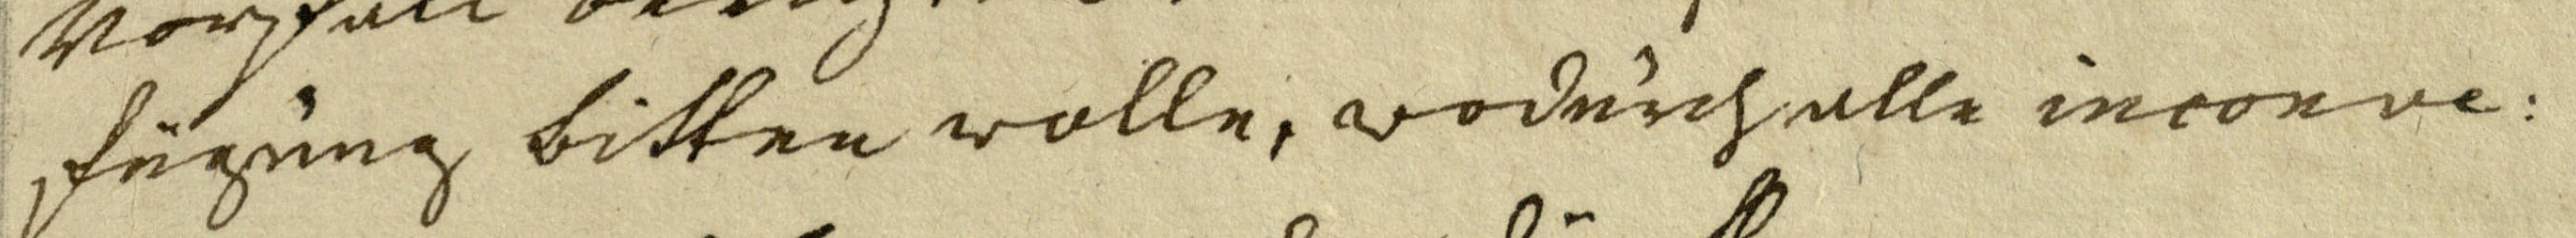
fügung bitten wolle, wodurch alle inconve¬
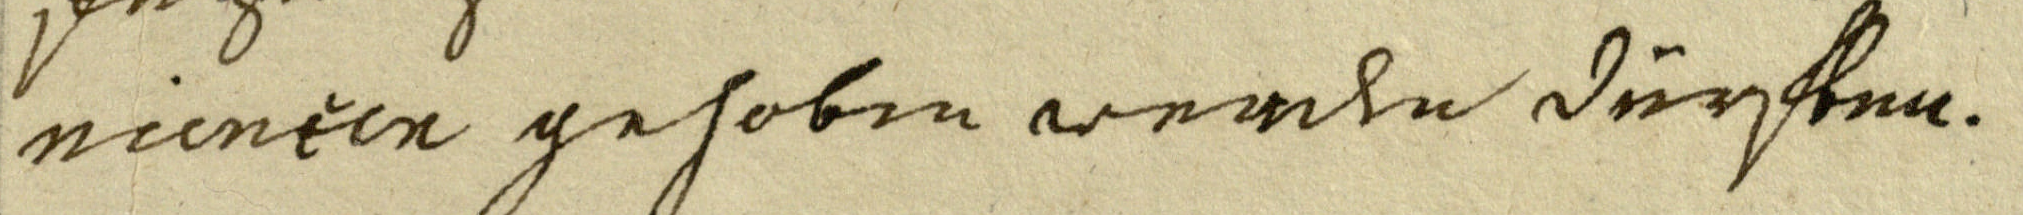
niencen gehoben werden dürften.
